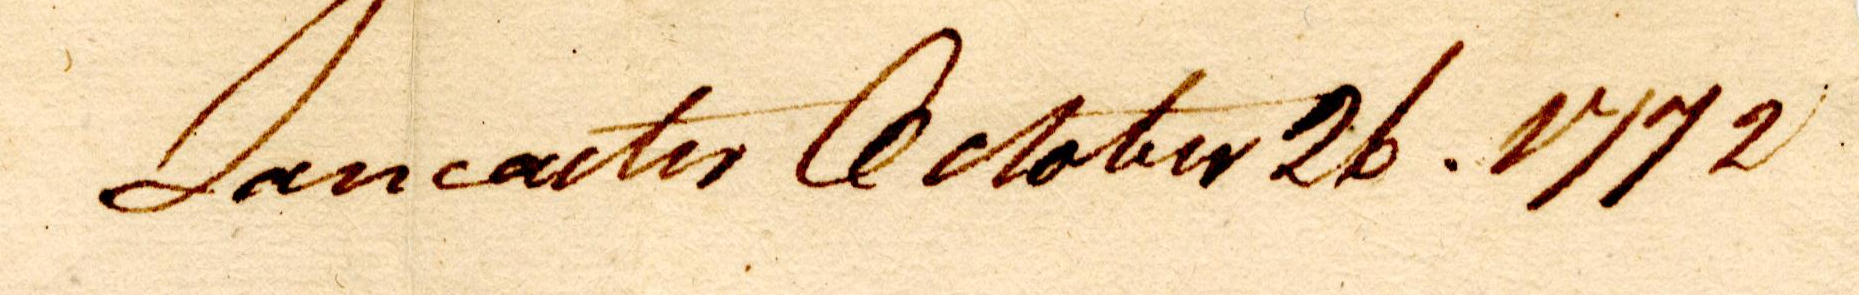Lancaster October 26 1772
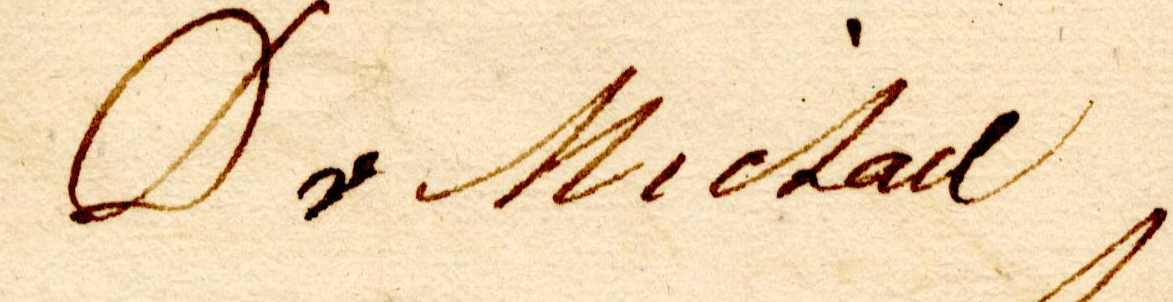Dr Michael
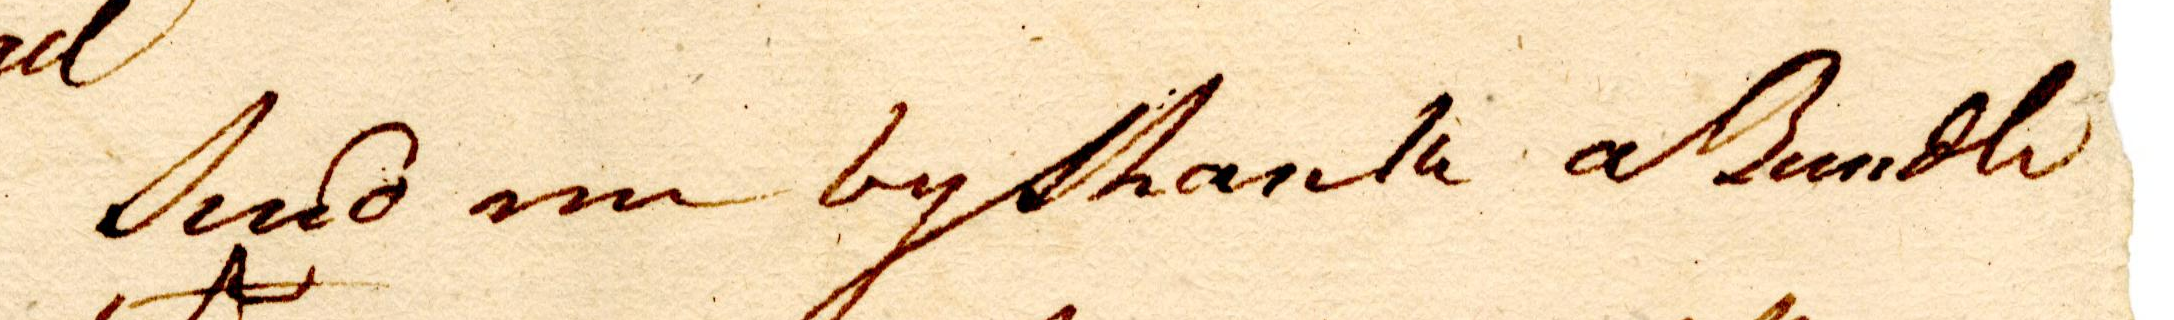Send me by Shank a Bundle
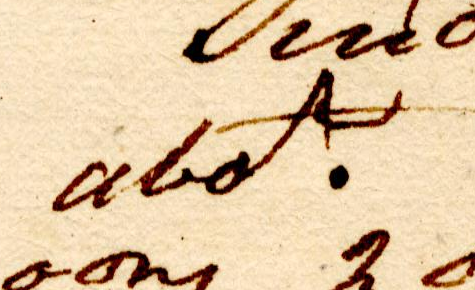abo^t.
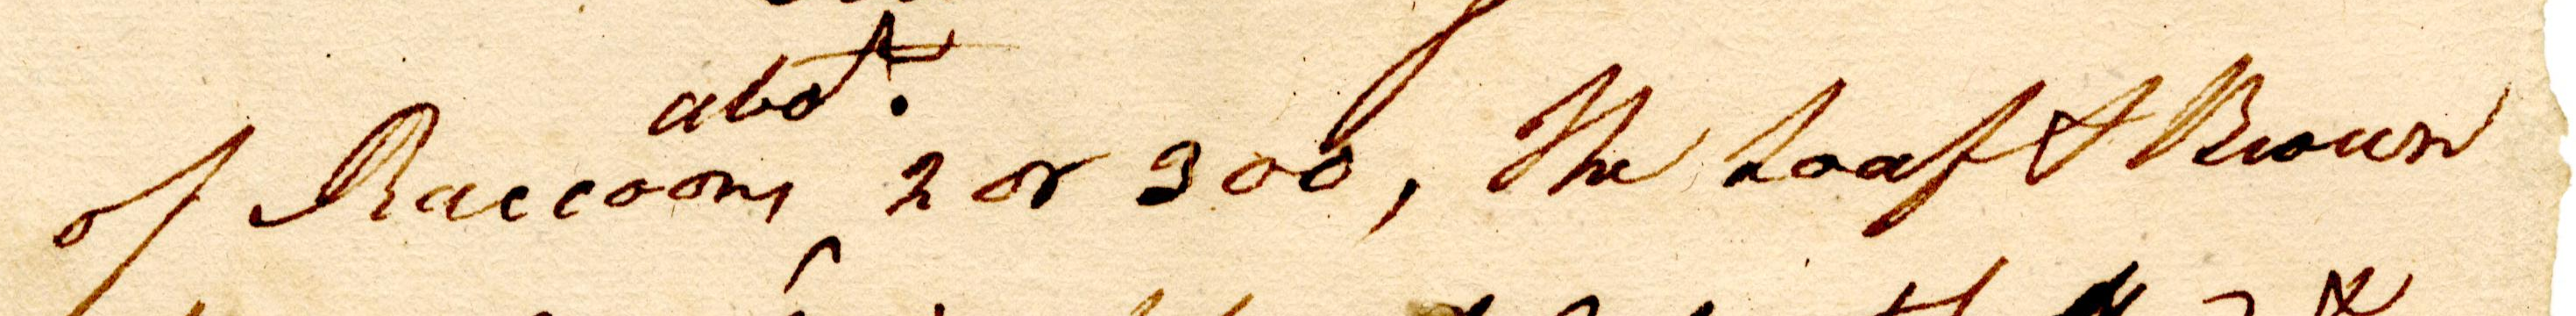of Racoons ^ 2 or 300, the Loaf & Brown
